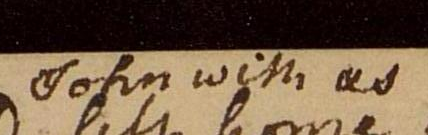John with us
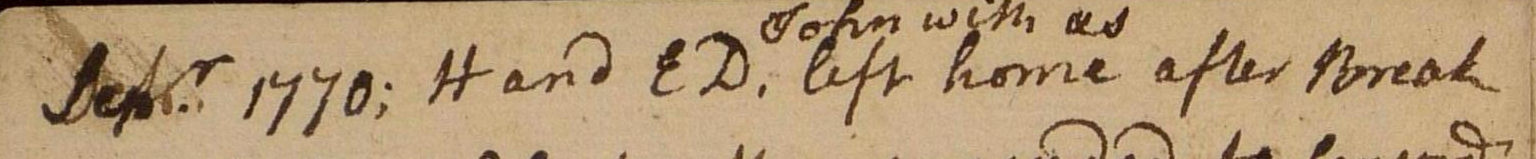Sep^r. 1770; Hand ED. left home after Break
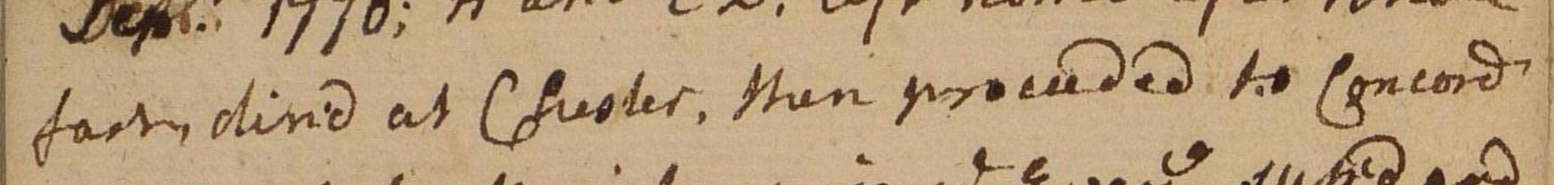fast, din'd at Chester, then proceeded to Concord
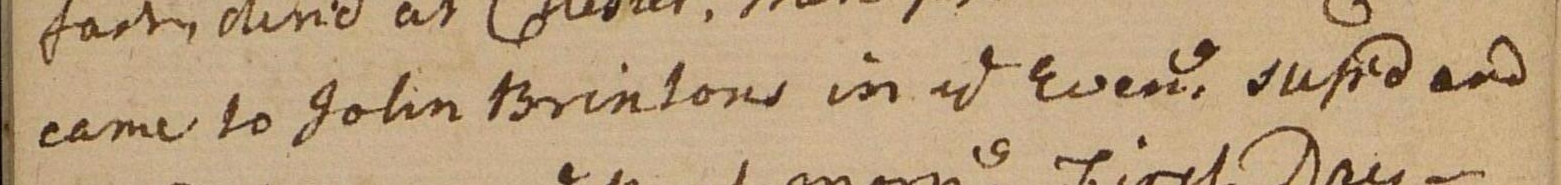came to John Brintons in y^e Even^g. sup'd and
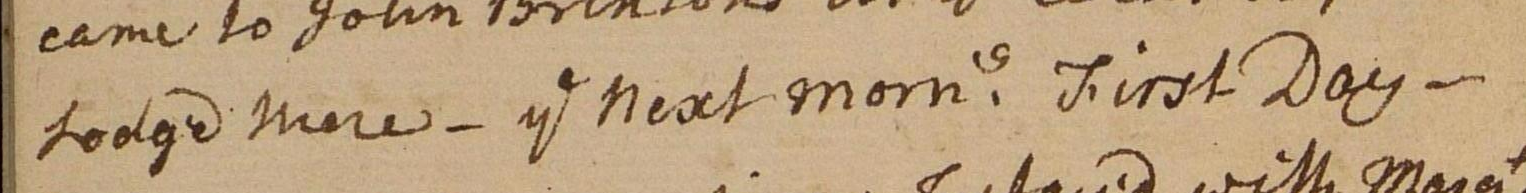Lodg'd there - y^e Next Morn^g. First Day -
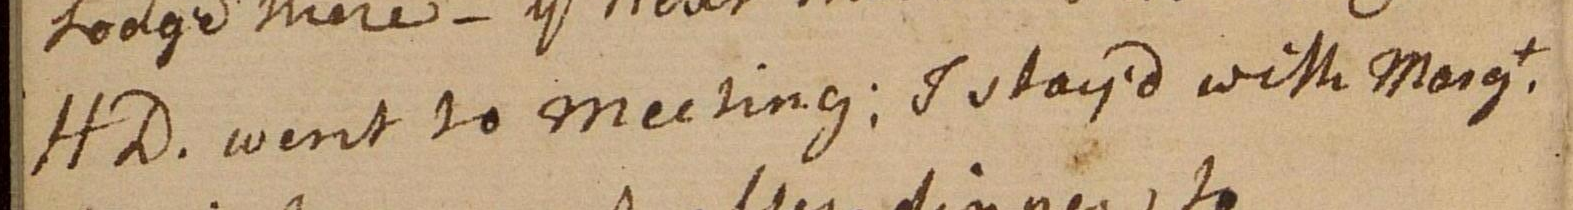HD. went to Meeting: I stay'd with Marg^t.
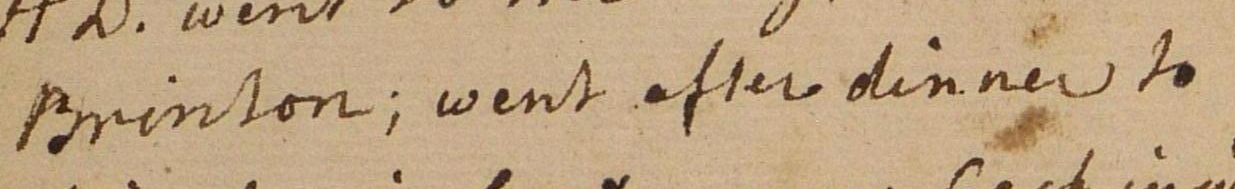Brinton; went after dinner to
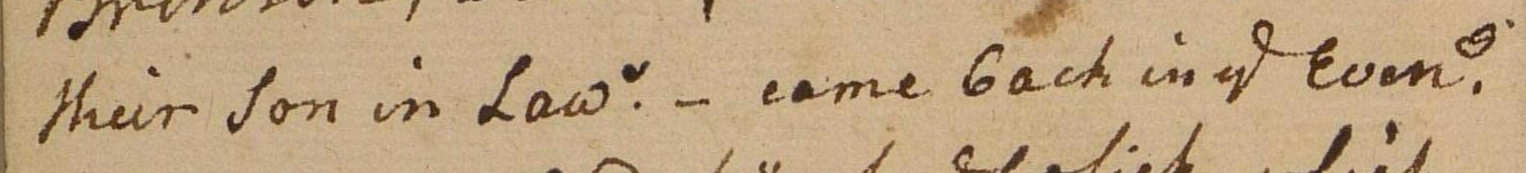their Son in Law^s. - came back in y^e Even^g.
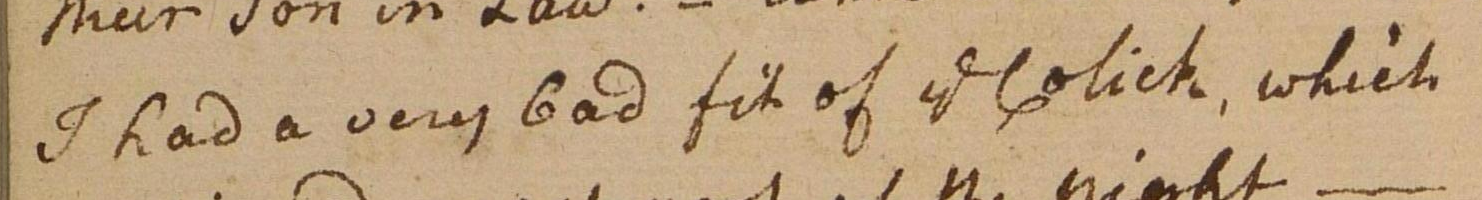I had a very bad fit of y^e Colick, which
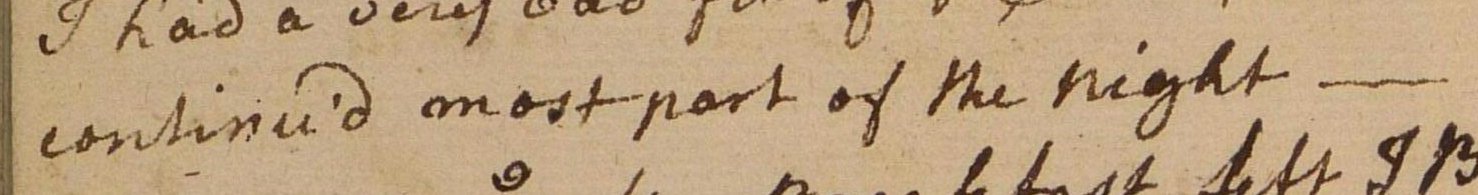continu'd most part of the night -
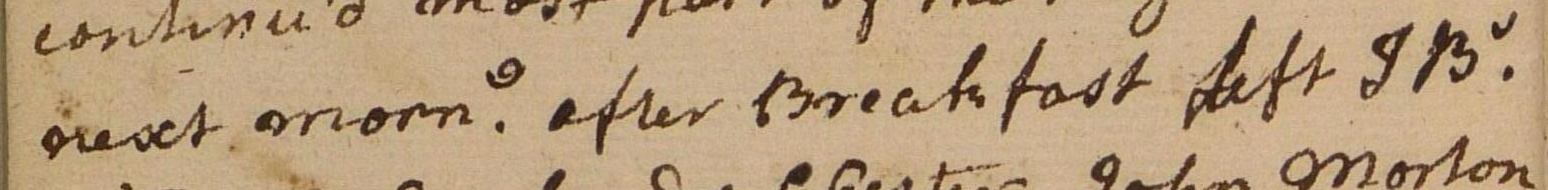next morn^g. after Breakfast left JB^s.
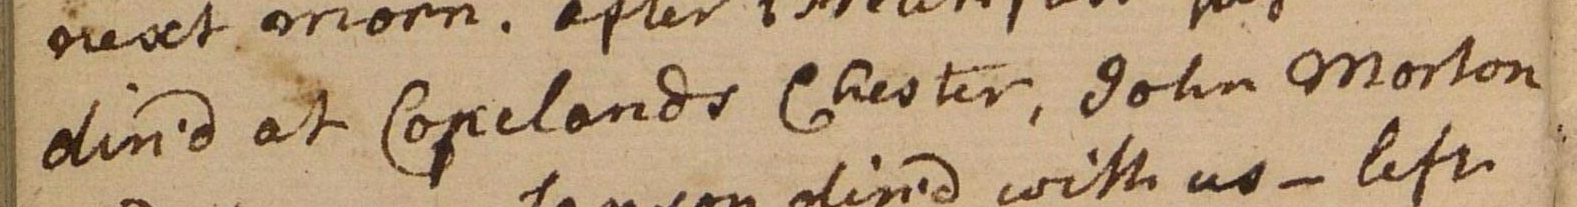din'd at Copelands Chester, John Morton
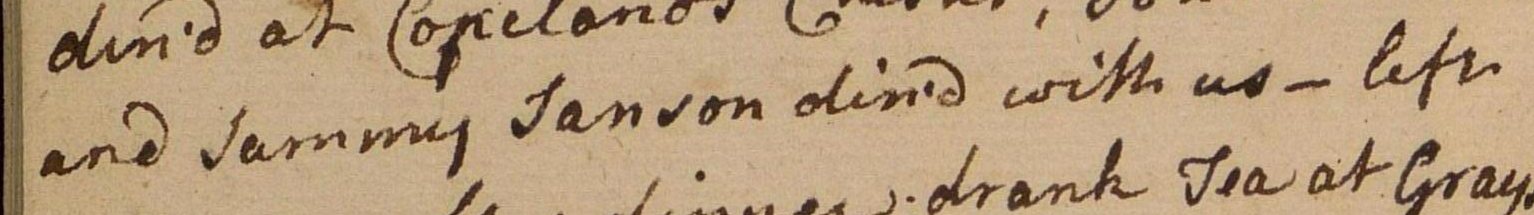and Sammy Sanson din'd with us- left
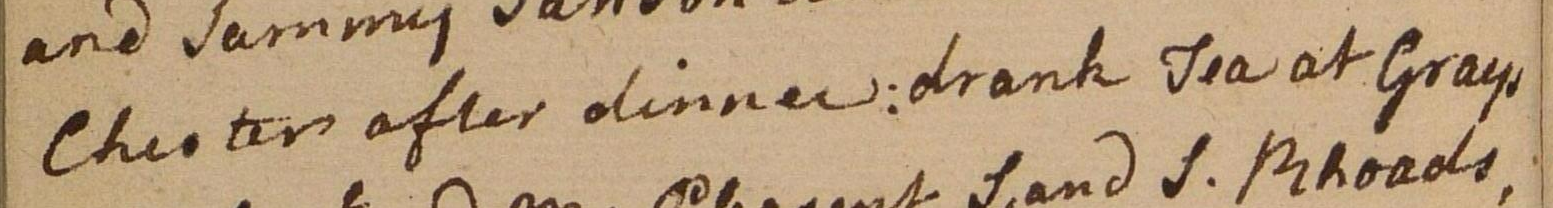Chester after dinner: drank Tea at Grays
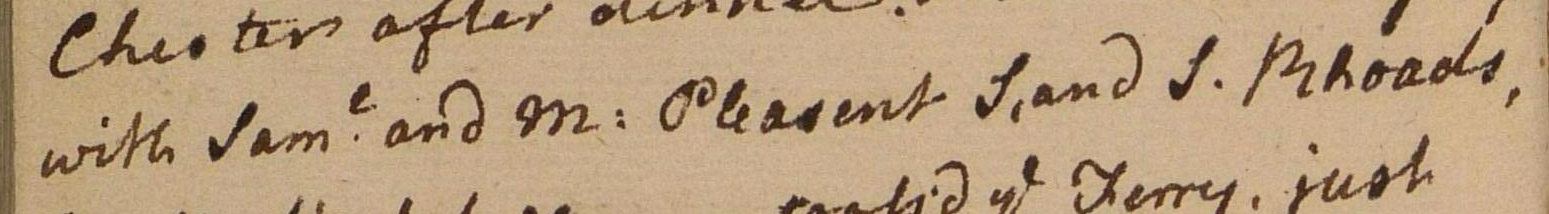with Sam^l. and M: Pleasant S. and S. Rhoads,
